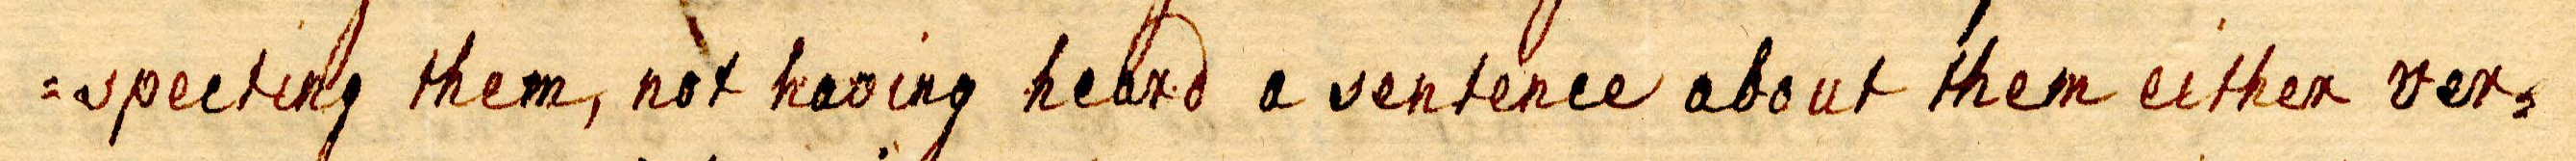-specting them, not having heard a sentence about them either ver-
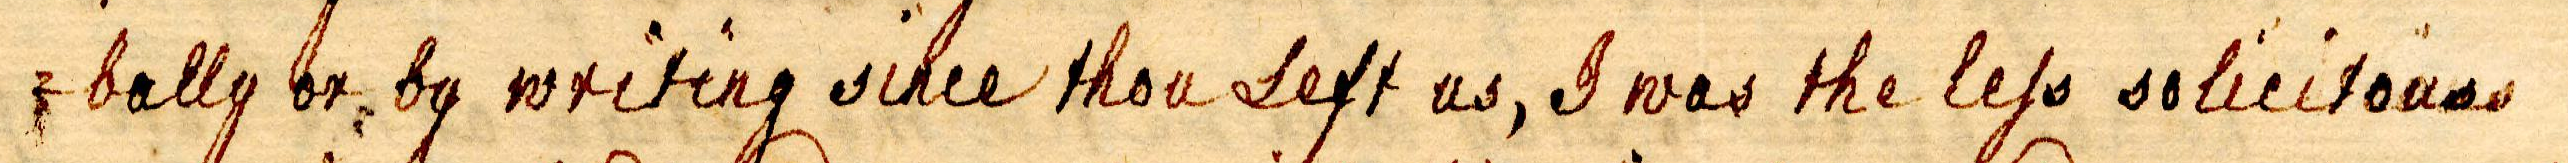-bally or by writing since thou left us, I was the less solicitous
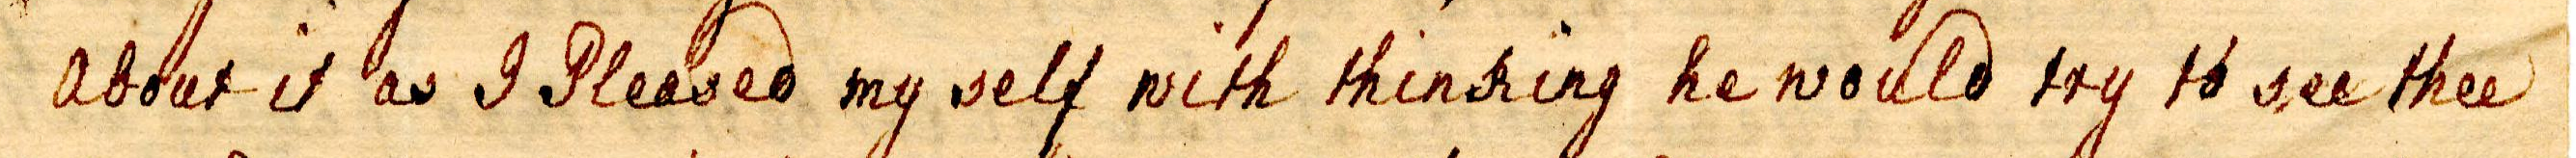about it as I pleased my self with thinking he would try to see thee
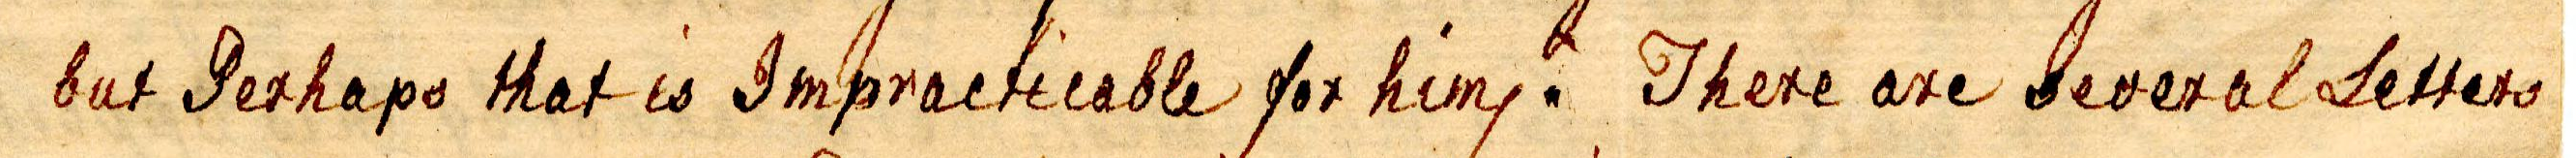but Perhaps that is Impracticable for him. There are several letters
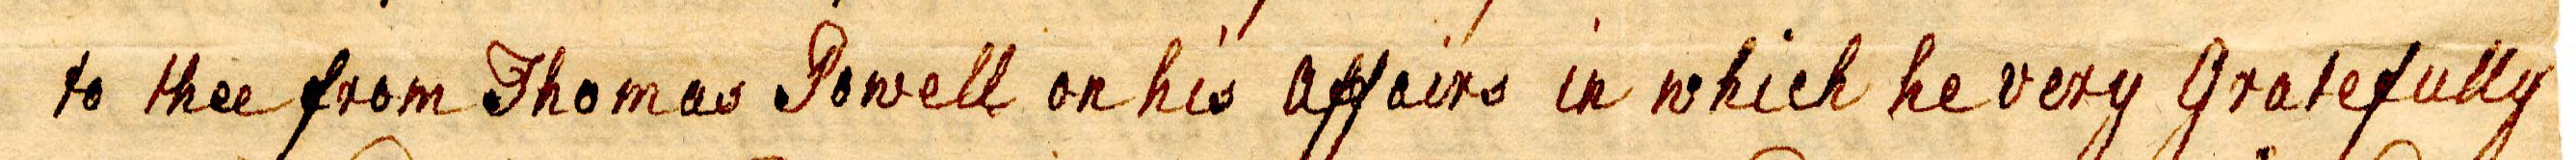to thee from Thomas Powell on his affairs in which he very gratefully
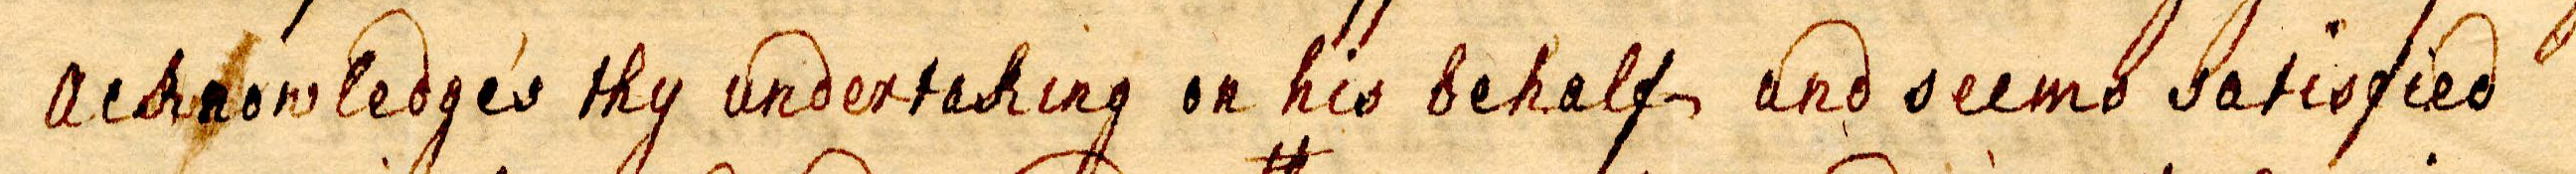acknowledges thy undertaking on his behalf and seems satisfied
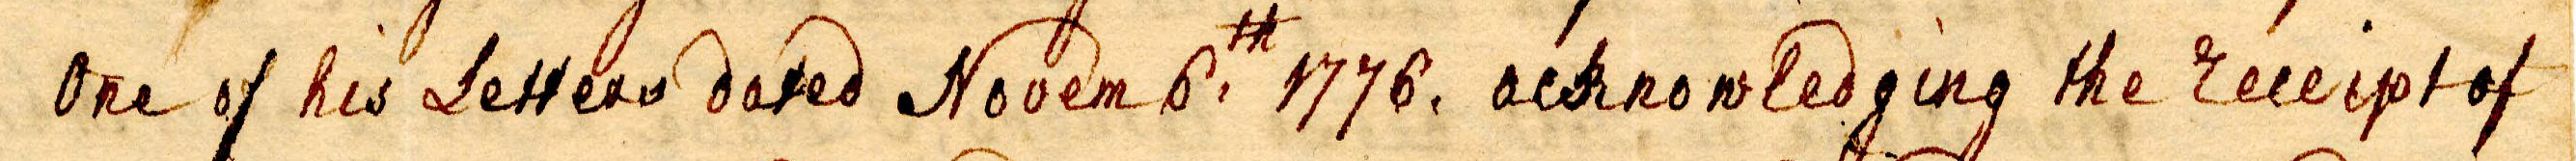one of his Letters dated Novem 6^th. 1776. acknowledging the receipt of
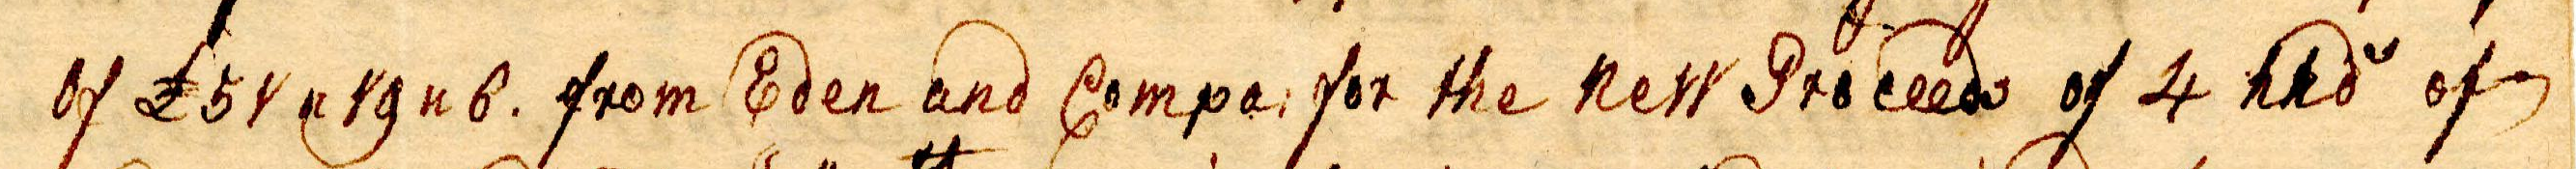of £51 '' 19 '' 6. from Eden and Compa: for the nett Proceeds of 4 hhd of
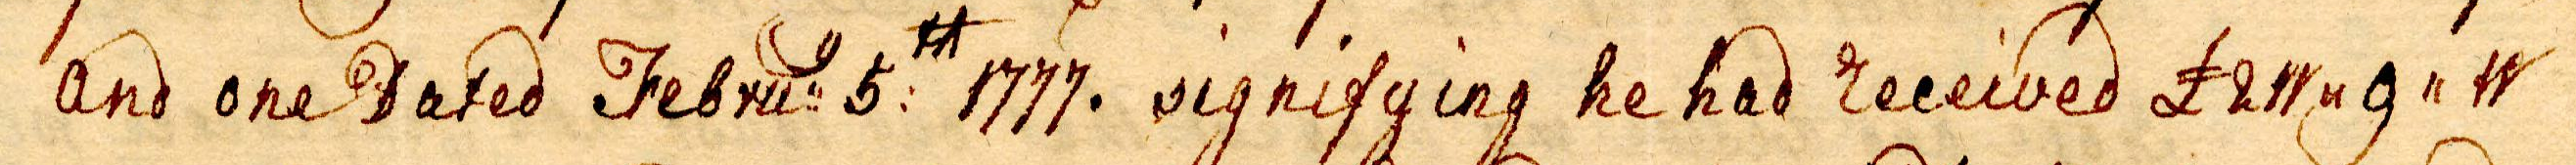and one dated Febru^y: 5^th: 1777. signifying he had received £211 '' 9 '' 11
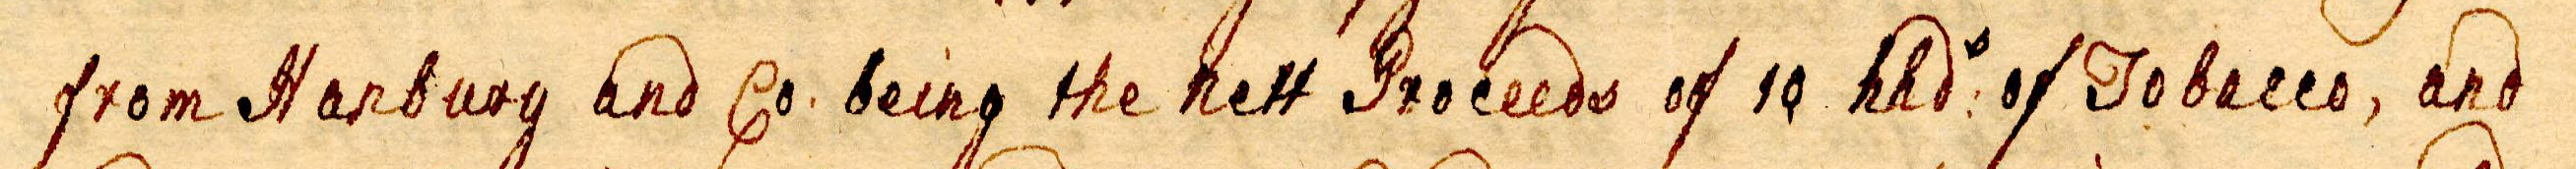from Harbury and Co. being the nett Proceeds of 10 hhd^s: of Tobacco, and
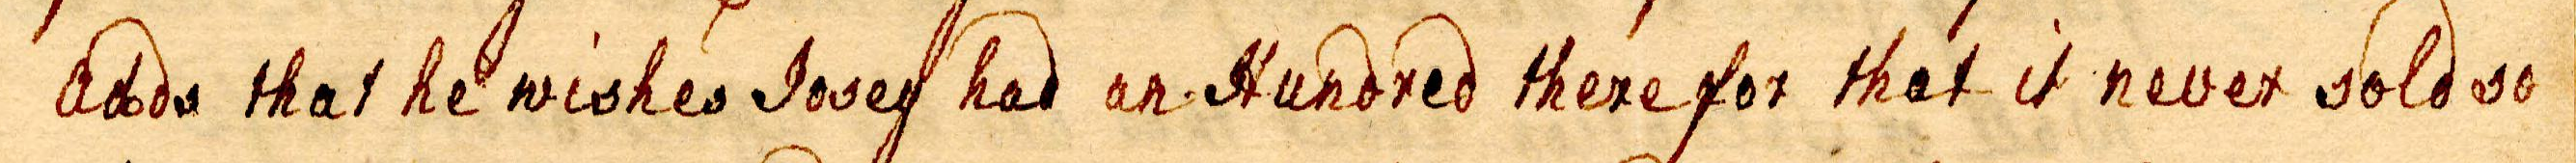adds that he wishes Josey had an Hundred therefor that it never sold so
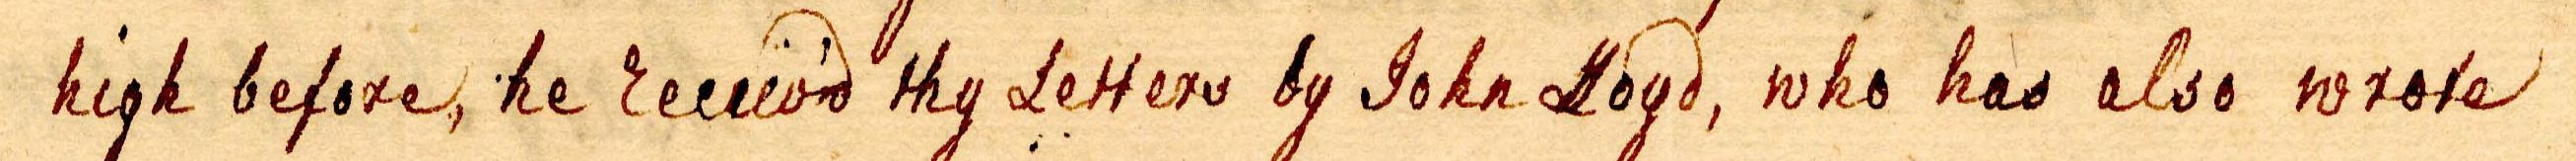high before, he receiv'd thy Letters by John LLoyd, who has also wrote
